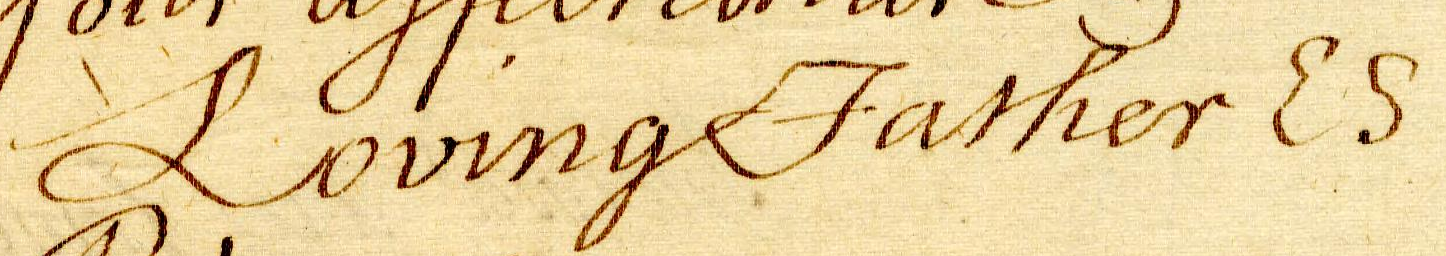Loving Father ES
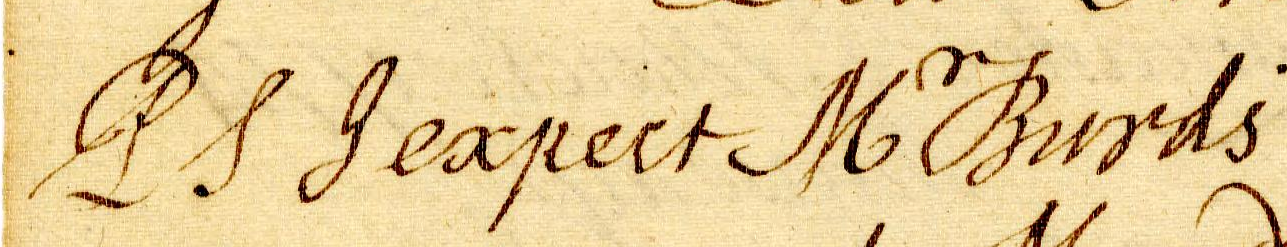PS I expect M^r Burds
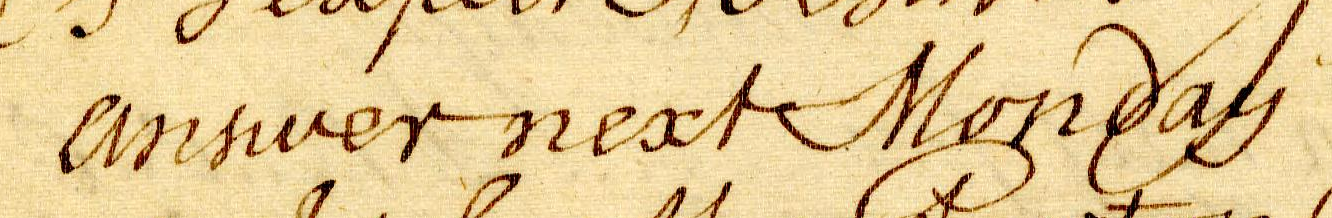answer next Monday
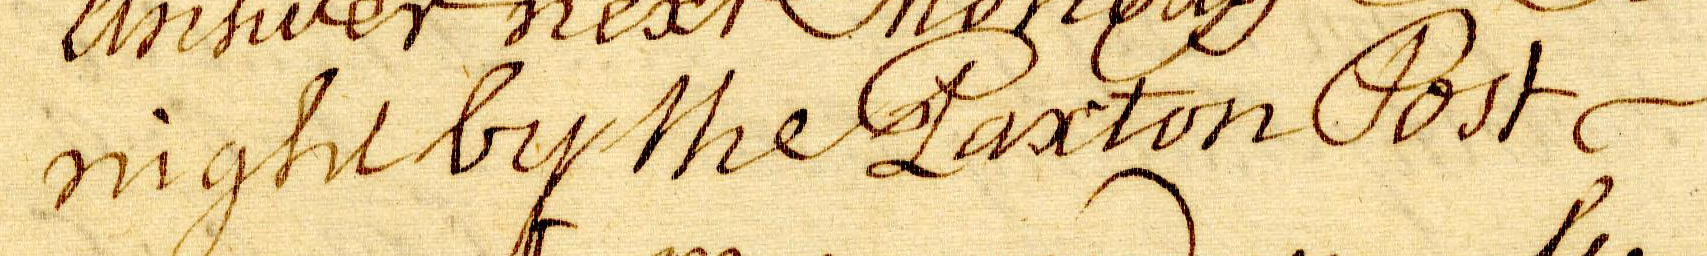night by the Paxton Post
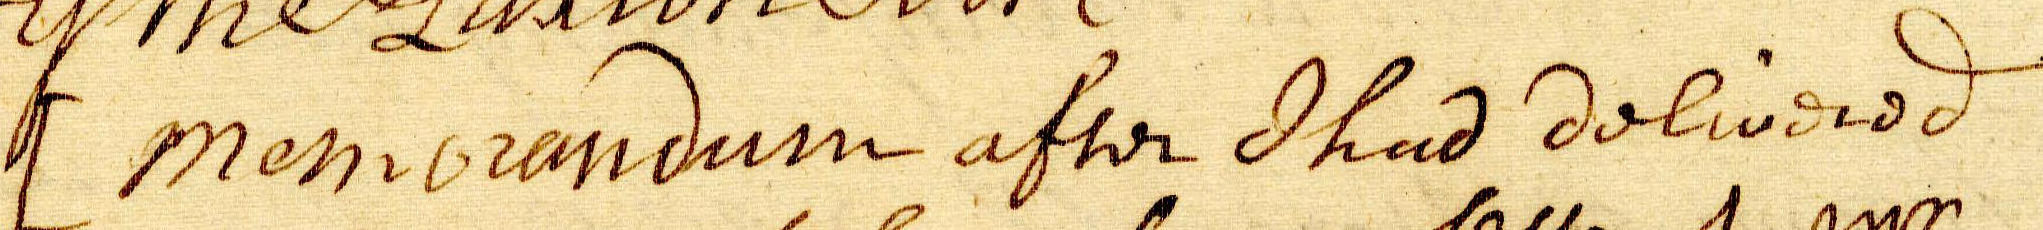(memorandum after I had delivered
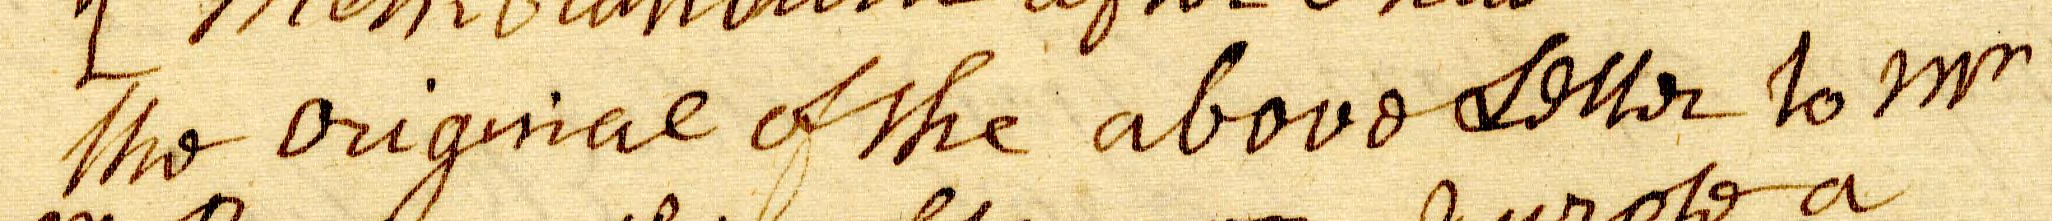the Original of the above Letter to M^r
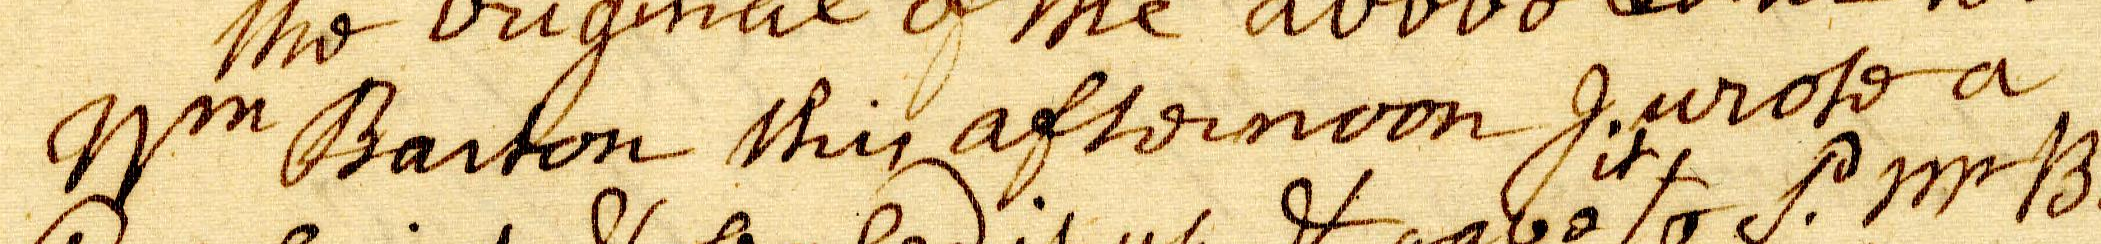W^m Barton this afternoon I wrote a
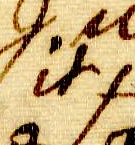it
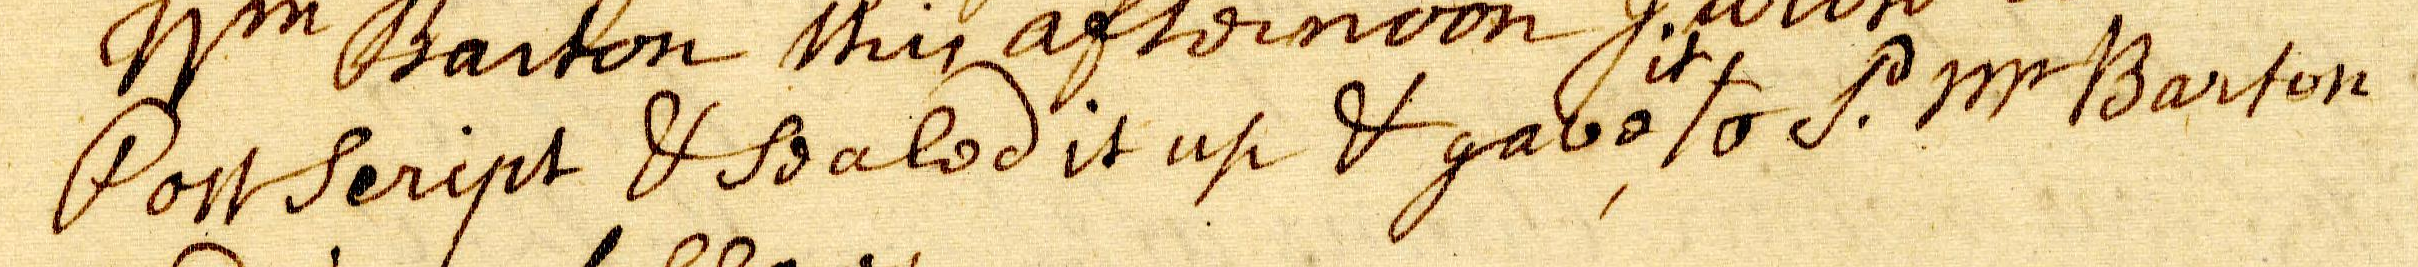Post Script & sealed it up & gave to s^d. M^r Barton
